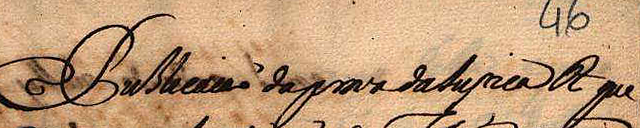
Publicaçaõ da prova da Iustiça A que
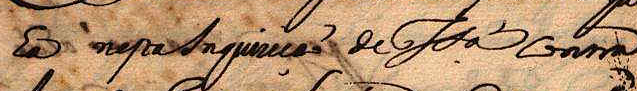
ha nesta Inquisiçaõ de Lx.a contra
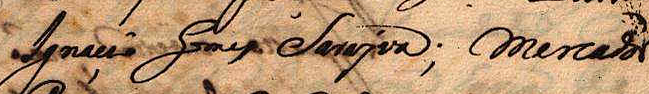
Ignacio Gomes Sarajva; mercador
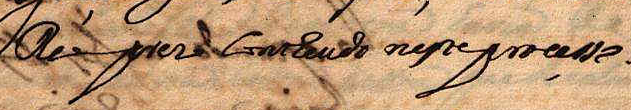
Reo prezo contheudo neste processo.
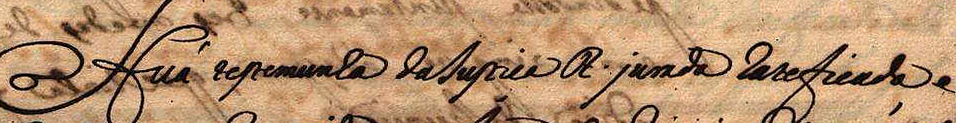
Huā testemunha da Iustiça A. jurada Rateficada, e
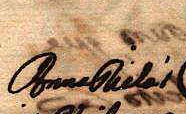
Anna Richar
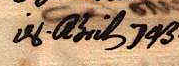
18 Abril 743.
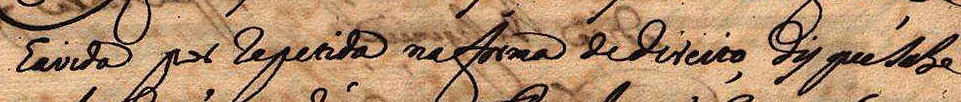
havida por Repetida na forma de direito, dis que sabe
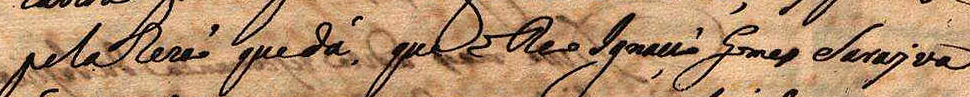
pela Rezaõ que dá que o Reo Ignacio Gomes Sarajva
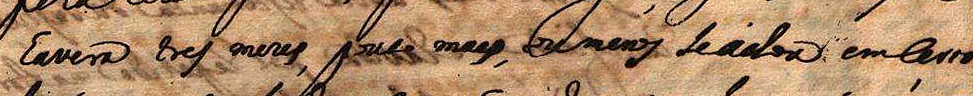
havera tres mezes, pouco maes, ou menos se achou em certo
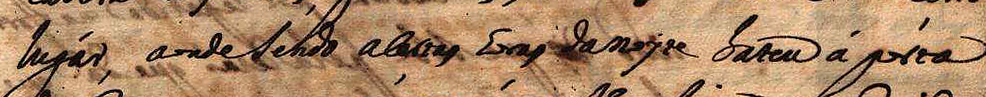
lugar, aonde sendo a certas horas da noyte bateu á porta
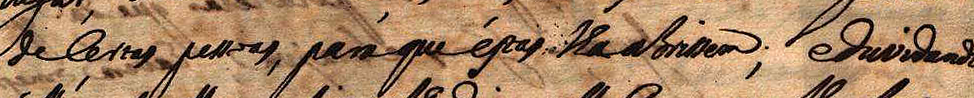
de Certas pessoas, para que estas lha abrissem; e duvidando
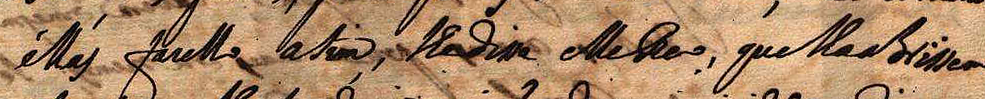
ellas fazello asim, lhe disse elle Reo, que lha abrissem
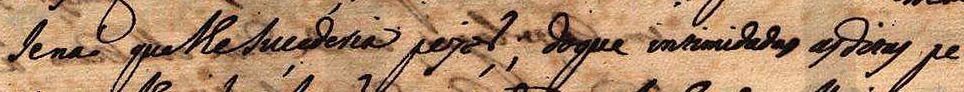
senaõ que lhe sucederia pejor; do que intimidadas as ditas pe
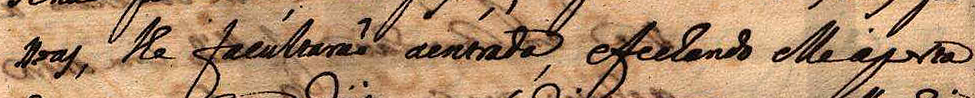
ssoas, lhe facultaraõ a entrada, e fechando elle a porta
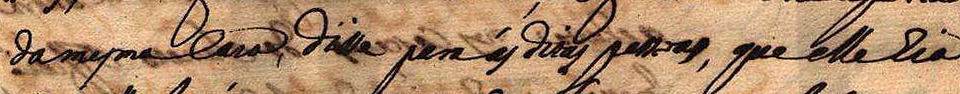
da mesma Caza, disse para as ditas pessoas, que elle hia
